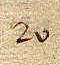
20
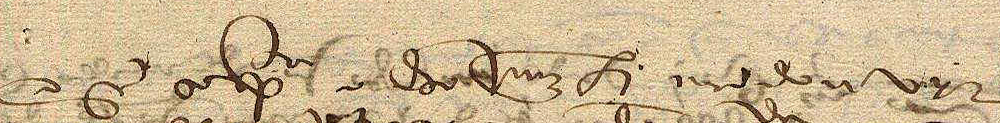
e sē sospta o dto Juiz hj mādou vyr
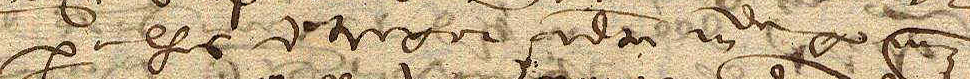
ꝑa lhes ētregar a dt̄ mda gomez
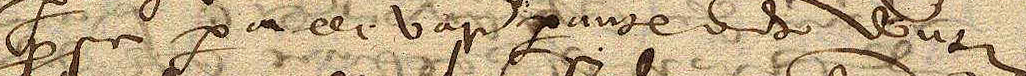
ꝓsa ꝑ a llevarē ꝑante dt̄ doutor
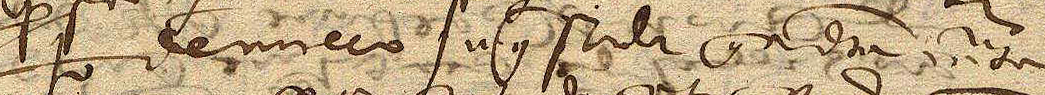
Jō de mello Jnq̄sidor q̄ a dt̄a carta
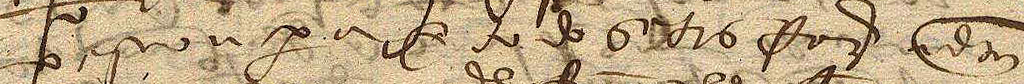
passou ꝑa ē todo satisfaz̄ a dt̄a
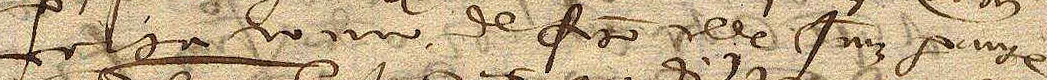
carta como de fctō elle Juiz ꝑante
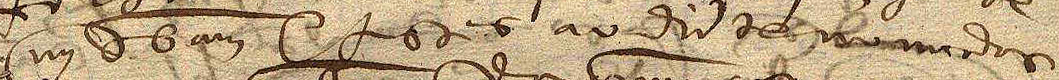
m̄j t̄bam e testes ao diēte nomeadas
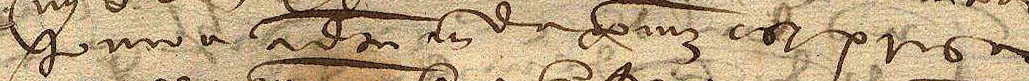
tomou a dt̄a mda gomez asy presa
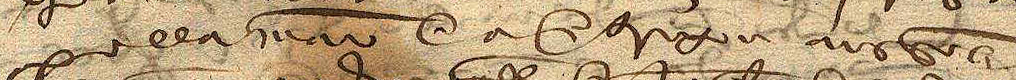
polla mão e a ētregou aos sōbr
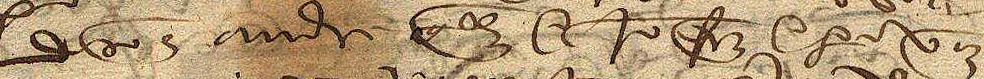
ditos andre ḡllz e Jō fr̄z e ꝑo vāz
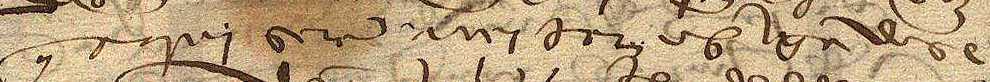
q̄ a qujserā aceitar obigādose
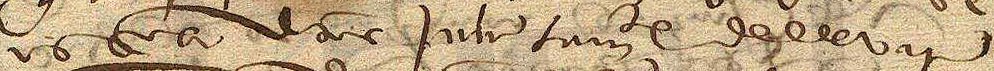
os sōbrdtōs Juūtamte de llevarē
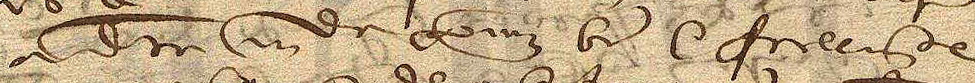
a d̄ta mda gomez bē e fiellmte
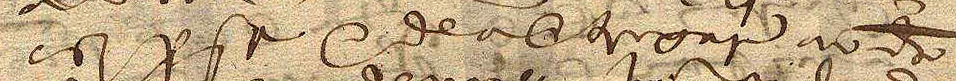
asj ꝑsa e de a ētregarē ao dt̄o
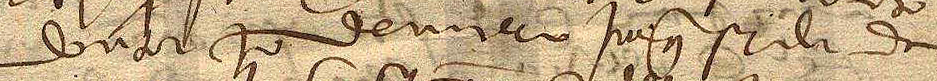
doutor Jō de mello Jmq̄sydor da
